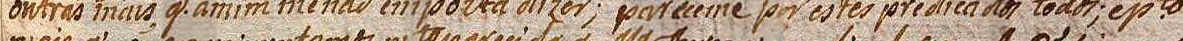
outras mais q̄ a mim me naõ emporta dizer; pareceme por estes predicados todos; e p.to
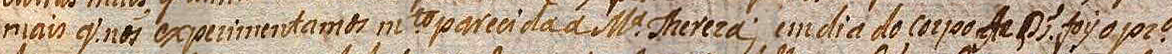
mais q̄ nós experimentamos m.to parecida a M.a Thereza; em dia do corpo de Ds̄ foy o pr.o
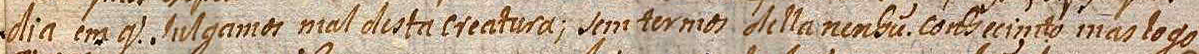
dia em q̄ Iulgamos mal desta creatura; sem termos della nenhū conhecimto mas logo
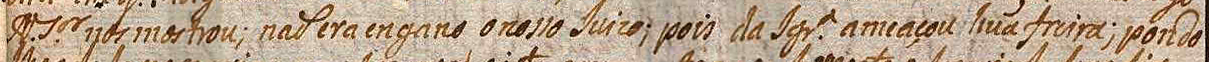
N. s.or nos mostrou; naõ era engano o nosso Iuizo; pois da Igr.a ameaçou huā freira; pondo
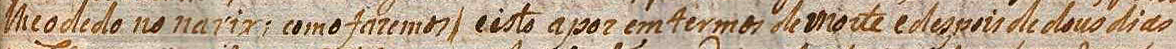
lhe o dedo no narix; como fazemos / e isto a poz em termos de morte, e despois de dous dias
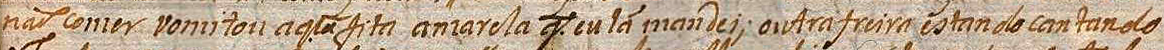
naõ comer vomitou aql̄a fita amarela q̄ eu lá mandei; outra freira estando cantando
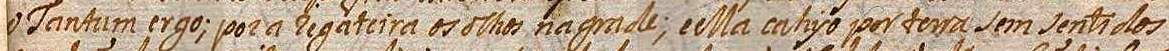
o Tantum ergo; pos a Regateira os olhos na grade; e ella cahyo por terra sem sentidos
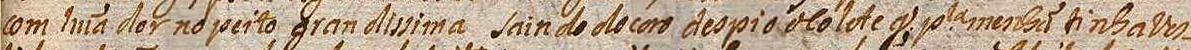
com huā dor no peito grandissima saindo do coro despio o colete q̄ p.la menhã tinha ves
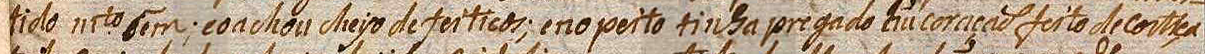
tido m.to bem; e o achou cheyo de feiticos; e no peito tinha pregado hū coraçaõ feito de cortiça
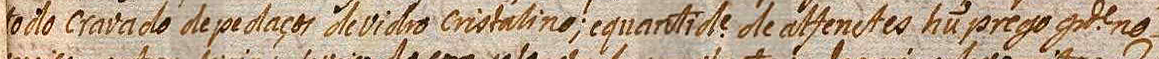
todo cravado de pedaços de vidro cristalino; e quantide de alfenetes hū prego gr.de no
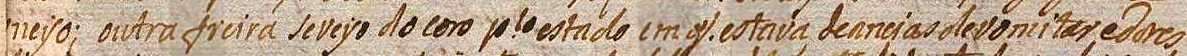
meyo outra freira se veyo do coro p.lo estado em q̄ estava de ancias de vomitar e dores
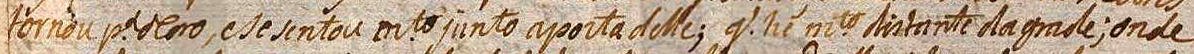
tornou p.a o coro, e se sentou m.to junto a porta delle; q̄ hé m.to distante da grade; onde
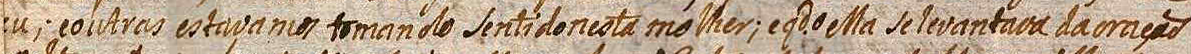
eu, e outras estavamos tomando sentido nesta molher; e qd.o esta se levantava da oração
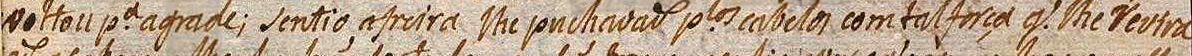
voltou p.a a grade; sentio a freira lhe puchavaõ p.los cabelos com tal força q̄ lhe revira
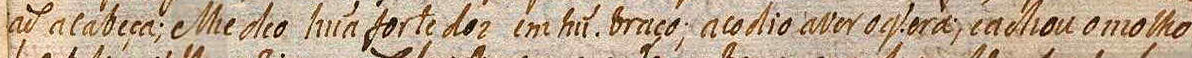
aõ a cabeça; e lhe deo huā forte dor em hū braço; acodio à ver o q̄. era; e achou o molho
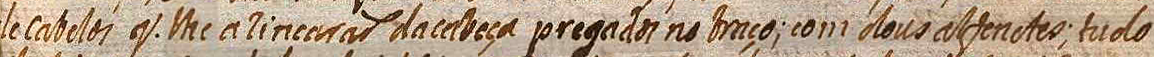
de cabelos q̄. lhe aRincaraõ da cabeça pregados no braço; com dous alfenetes; tudo
